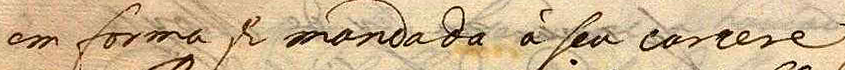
em forma, E mandada á seu carcere,
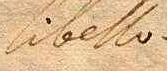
libello
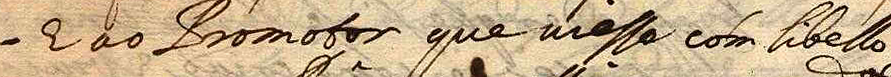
E ao Promotor que uiesse com libello
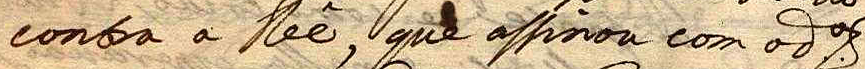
contra a Reê, que assinou com o d.o s.r
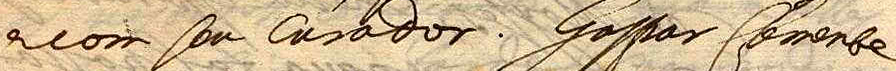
E com seu curador. Gaspar Clemente
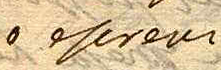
o escreui
